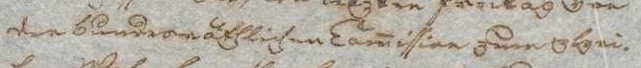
der bundesräthlichen Commission zum zwei-
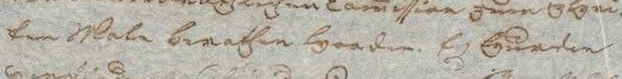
ten Male berathen worden. Es wurden
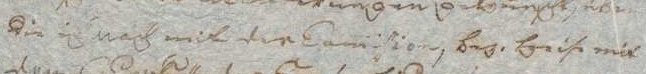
die ich noch mit der Commission, bez.weise mit
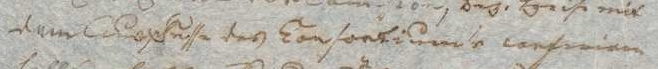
dem Ausschusse des Consortium's conferiren
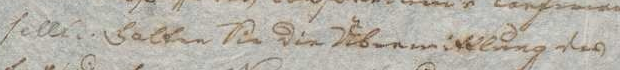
sollte. Halten Sie die Übermittlung des
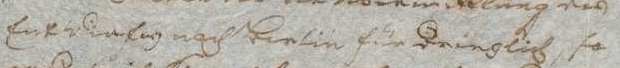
Entwurfes nach Berlin für dringlich, so
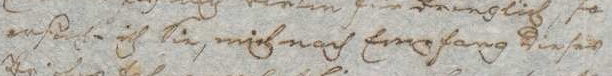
ersuche ich Sie, mich nach Empfang dieses
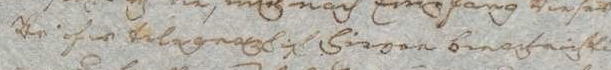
Briefes telegraphisch hievon benachrichti-
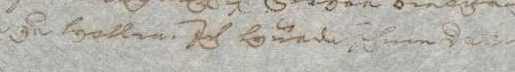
gen zu wollen. Ich würde Ihnen dann
